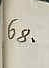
68.
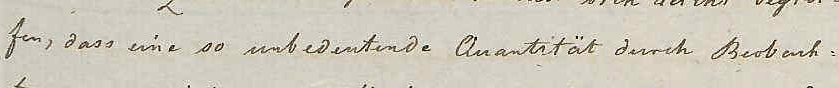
fen, dass eine so unbedeutende Quantität durch Beobach-
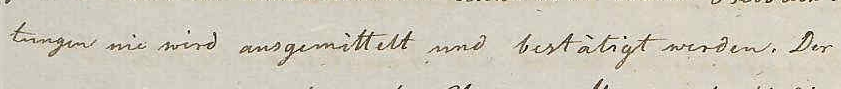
tungen nie wird ausgemittelt und bestätigt werden. Der
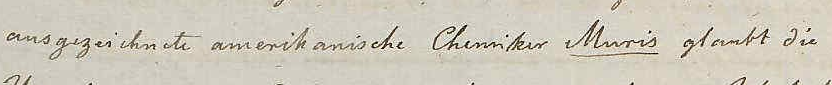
ausgezeichnete amerikanische Chemiker Muris glaubt die
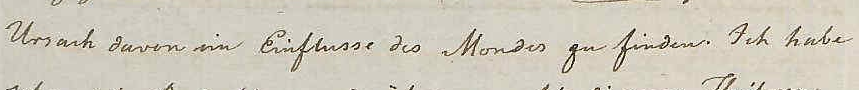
Ursach davon im Einflusse des Mondes zu finden. Ich habe
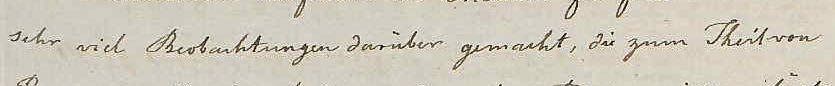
sehr viel Beobachtungen darüber gemacht, die zum Theil von
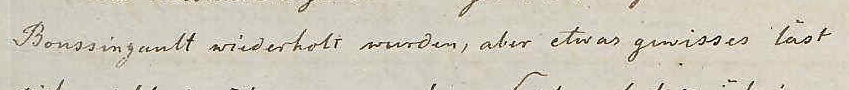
Boussingault wiederholt wurden, aber etwas gewisses läst
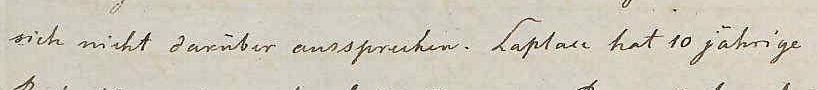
sich nicht darüber aussprechen. Laplace hat 10 jährige
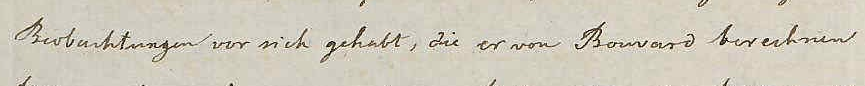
Beobachtungen vor sich gehabt, die er von Bouvard berechnen
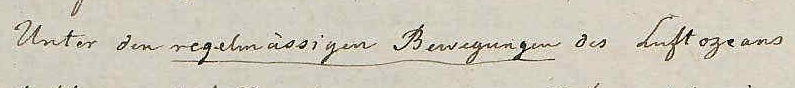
Unter den regelmässigen Bewegungen des Luftozeans
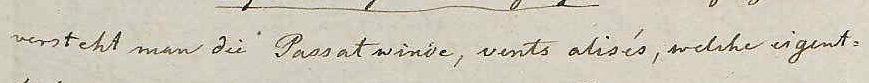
versteht man die Passatwinde, vents alisés, welche eigent-
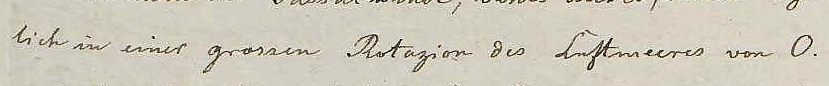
lich in einer grossen Rotazion des Luftmeeres von O.
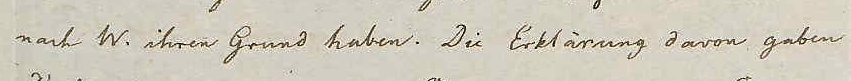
nach W. ihren Grund haben. Die Erklärung davon gaben
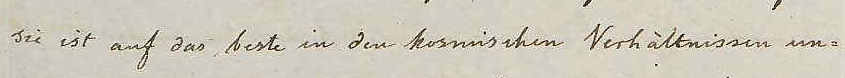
sie ist auf das beste in den kosmischen Verhältnissen un-
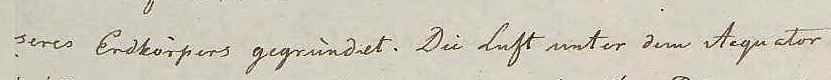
seres Erdkörpers gegründet. Die Luft unter dem Aequator
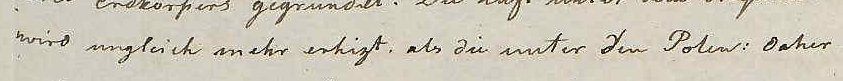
wird ungleich mehr erhizt als die unter den Polen: daher
